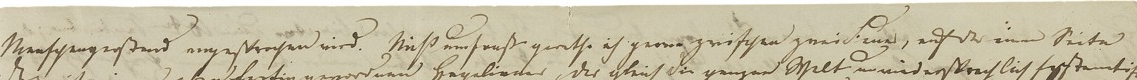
Nicht umsonst gerathe ich gerne zwischen zwei Feuer, auf der einen Seite
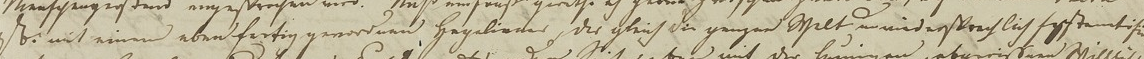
zB. mit einem eben fertig gewordnen Hegelianer, der gleich die ganzen Welt unwidersprechlich systematisirt
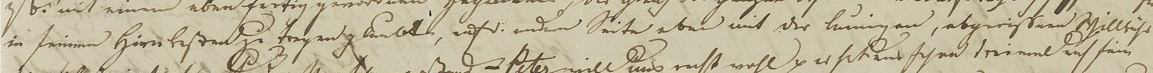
in seinem Hirnkasten zu tragen glaubt, auf d. andern Seite aber mit der launigen, abgerissnen Willkühr
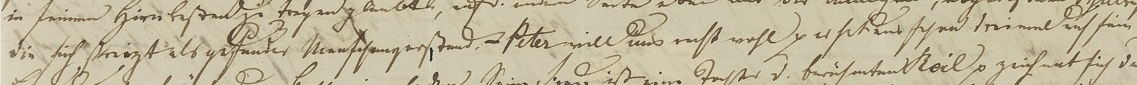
die sich spreizt als gesunder Menschenverstand. – Peter will uns recht wohl & er hat uns schon dreimal auf sein
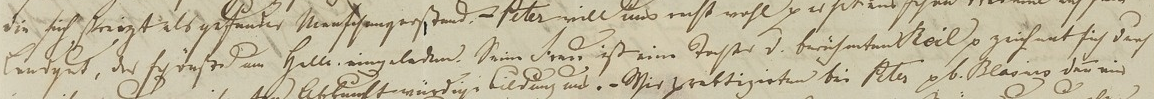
Landgut, das schönste um Halle, eingeladen. Seine Frau ist eine Tochter d. berühmten Reil & zeichnet sich durch
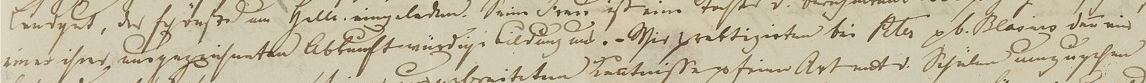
einer ihrer ausgezeichneten Abkunft würdige Bildung aus. Wir praktizirten bei Peter & b. Blasius denn wir
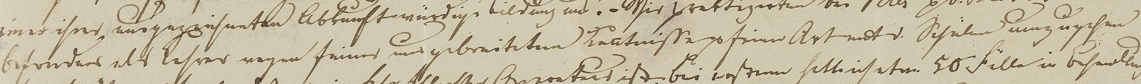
besonders als Lehrer wegen seiner ausgebreiteten Kenntnisse & seiner Art mit d. Schülern umzugehen
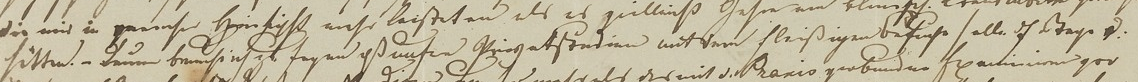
hätten. Kaum brauche ich zu sagen dß unsere Privatstudien mit dem fleißigen Besuche (alle 7 Tage d.
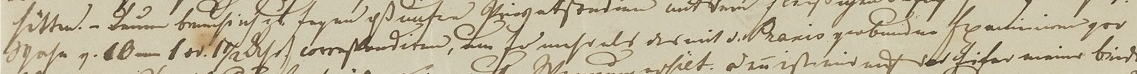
Woche v. 10–1 od. 1½ Uhr) correspondiren, um so mehr als das mit d. Praxis verbundne Examiniren vor
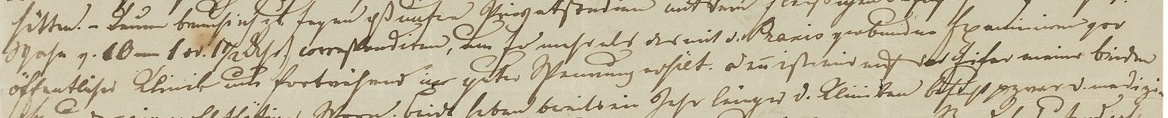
öffentlicher Klinik uns fortwährend in guter Spannung erhält. Dann ist mir auch der Eifer meiner beiden
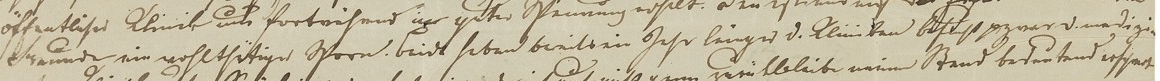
Freunde ein wohlthätiger Sporn. Beide haben bereits ein Jahr länger d. Kliniken besucht & zwar d. medizi-
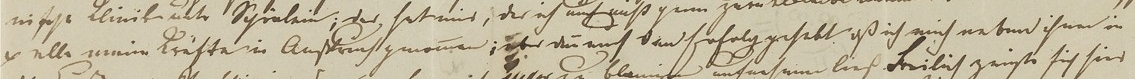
& alle meine Kräfte in Anspruch genommen; aber dann auch den Erfolg gehabt dß ich mich neben ihnen in
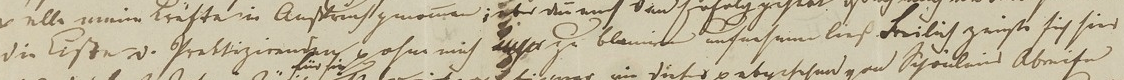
die Liste d. Praktizirenden & ohne mich zu blamiren aufnehmen ließ. Freilich zeigte sich hier
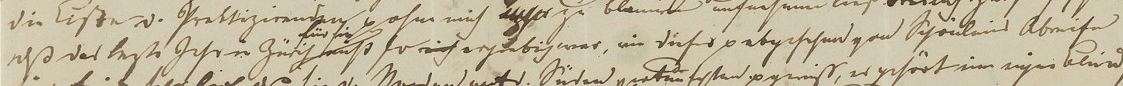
dß das lezte Jahr in Zürich für sie nicht so ergiebig war, wie dieses & abgesehen von Schönleins Abreise
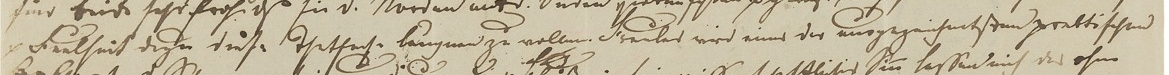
Faulheit dazu diese Thatsache leugnen zu wollen. Freuler wird einer der ausgezeichnetsten praktischen
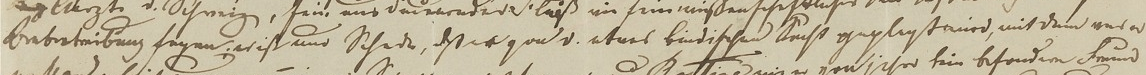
Uebertreibung sagen; es ist nur Schade, dß er von d. etwas kindischen Sucht geplagt wird, mit dem was er
